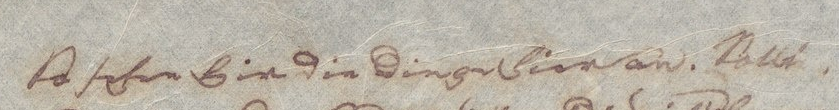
So sehen wir die Dinge hier an. Sollten
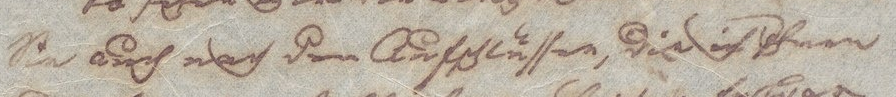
Sie auch nach den Aufschlüssen, die ich Ihnen
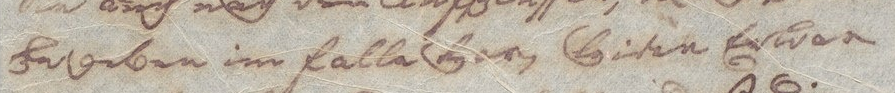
zu geben im Falle war, wider Erwar-
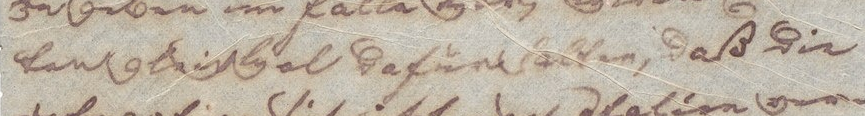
ten gleichwol dafür halten, daß die
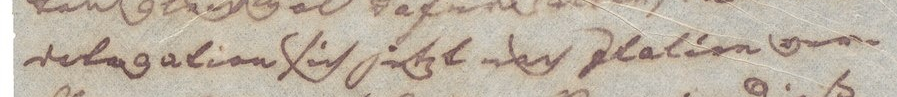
Delegation sich jetzt nach Italien ver-
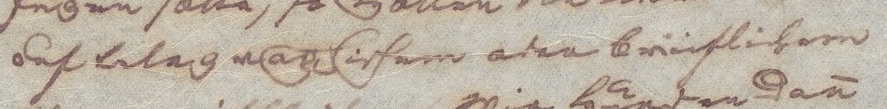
auf telegraphischem oder brieflichem
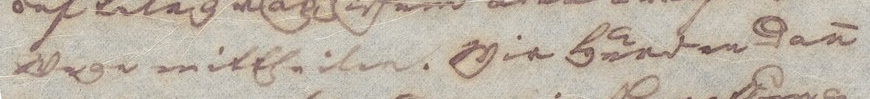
Wege mittheilen. Wir würden dann
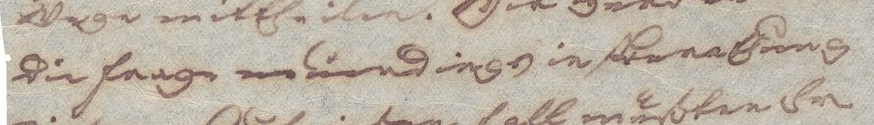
die Frage neuerdings in Berathung
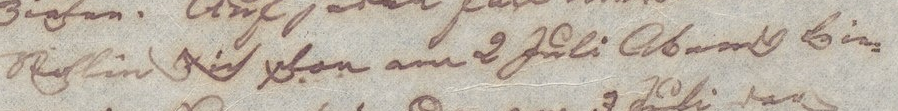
Stehlin & ich schon am 2 Juli Abends wie-
